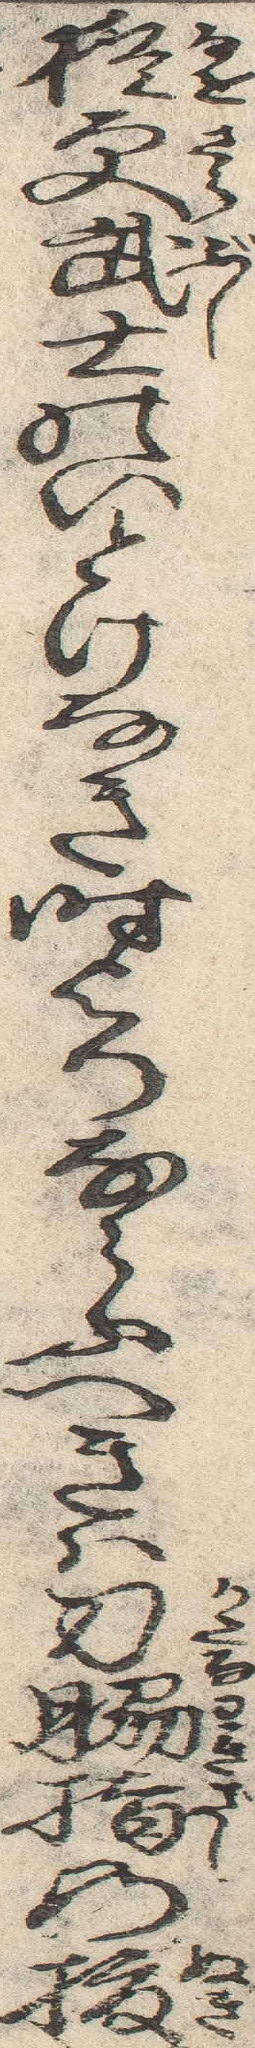猶更武士のいとけなき時よりならふへきは刀脇指の抜
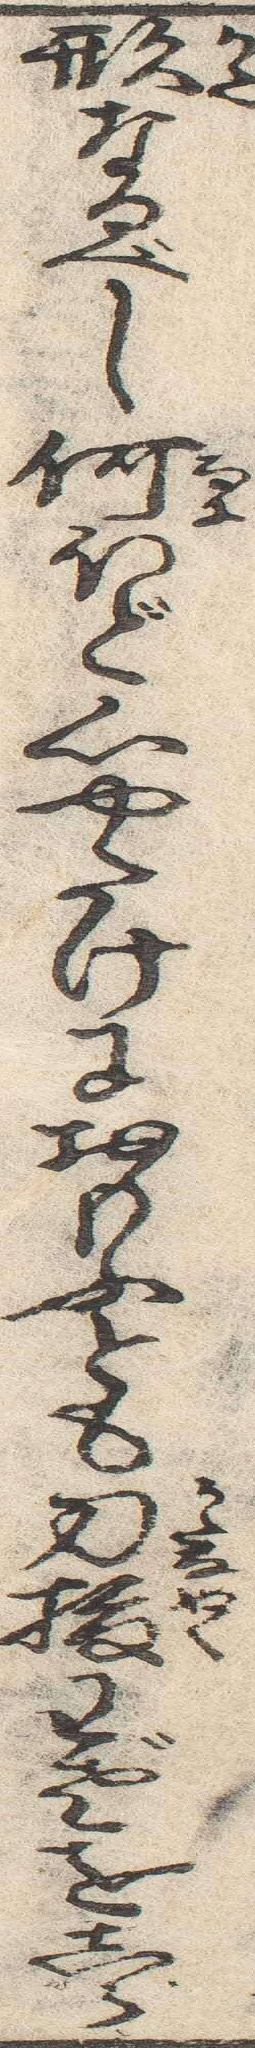形なるべし何ほど心やたけにおもふとも刀抜わざをしら
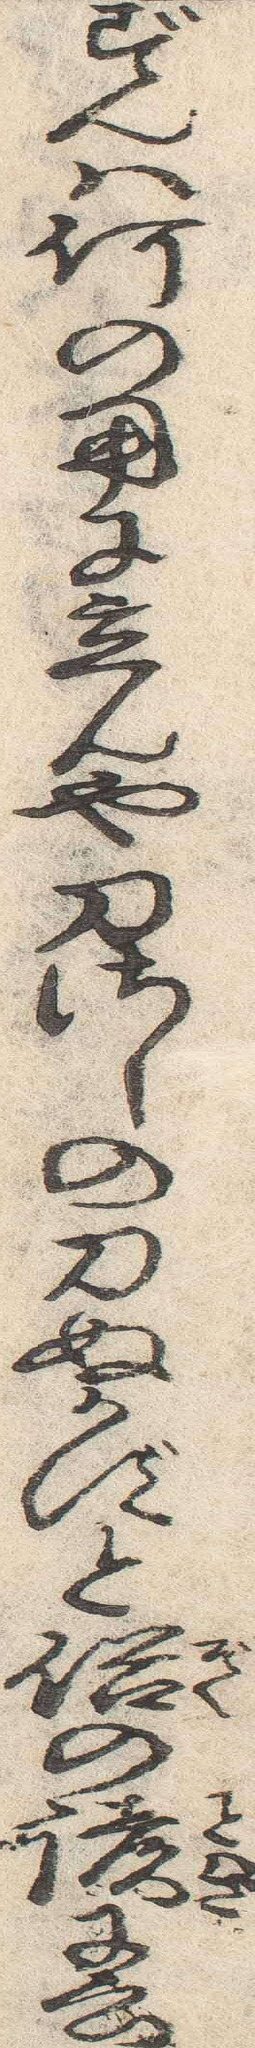ずんは何の用に立んや刀さしの刀ぬかずと俗の諺に云
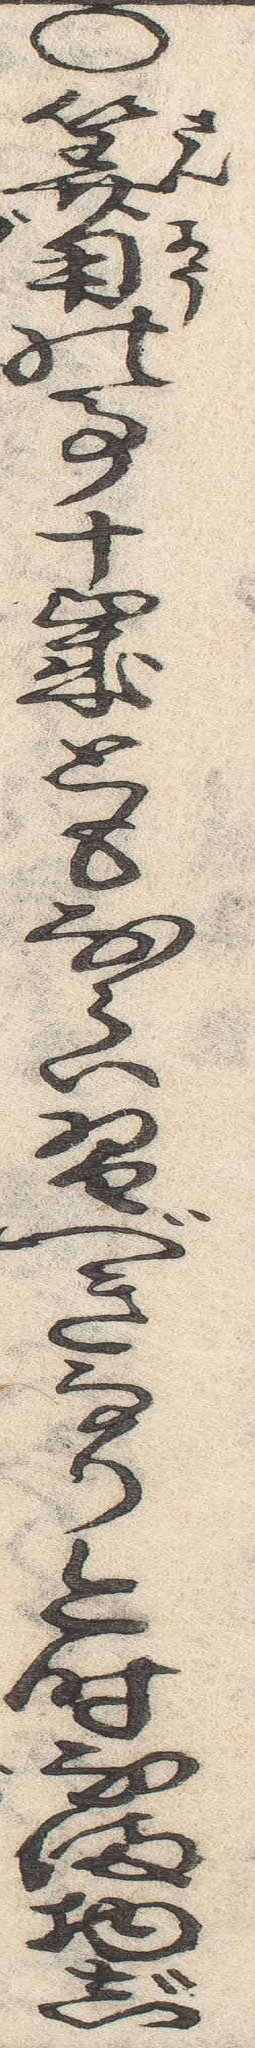○算用の事十歳ともならは習べきなり今時不満物じ
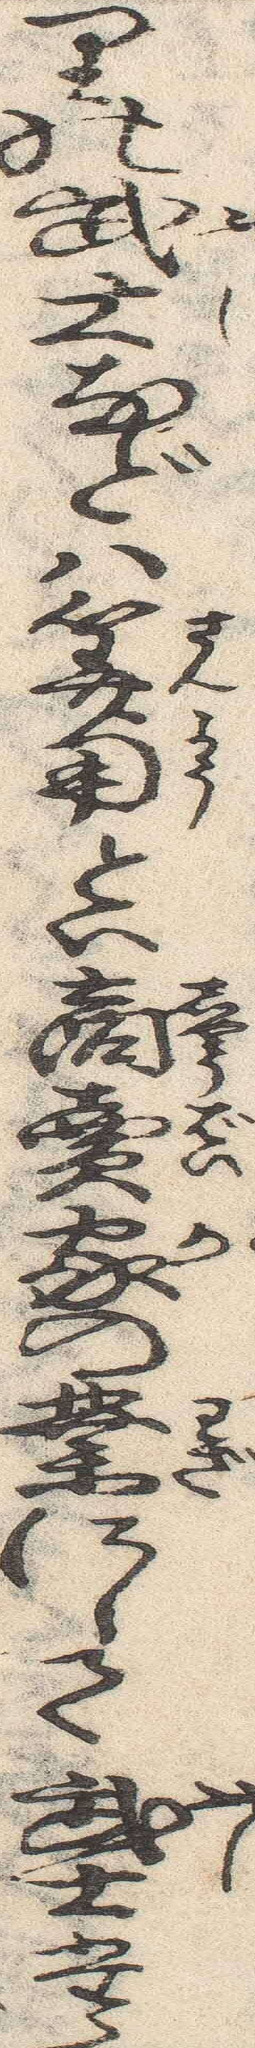りの武士などは算用とは商売家の業にして武士たら
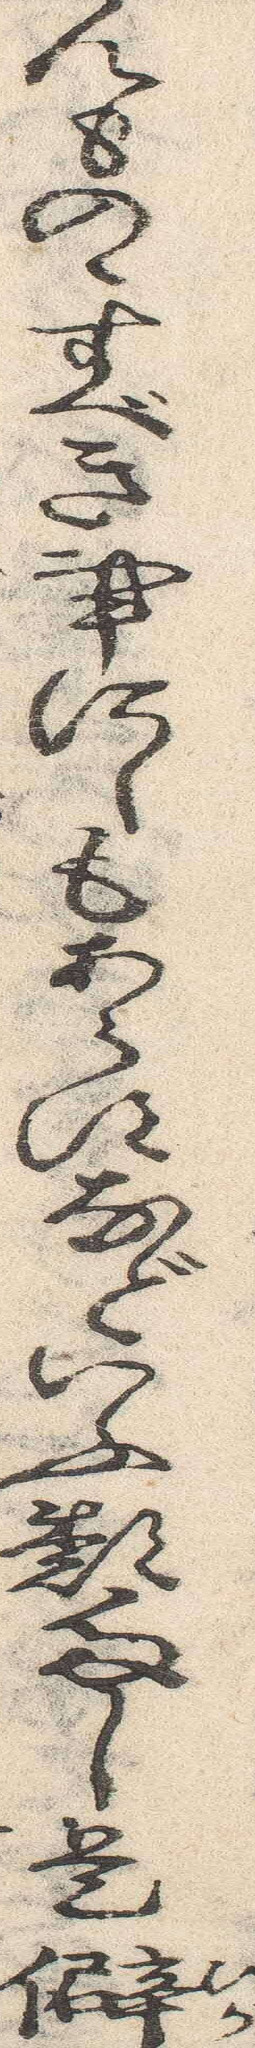んものゝすべき事にしもあらすなどいふ類多し是僻
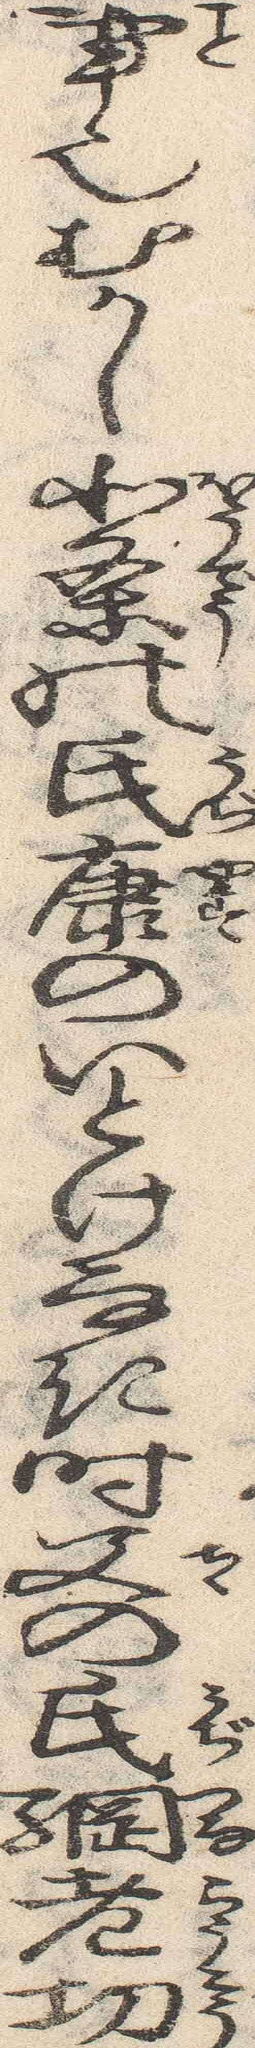事也むかし北条の氏康のいとけなき時父の氏綱老功
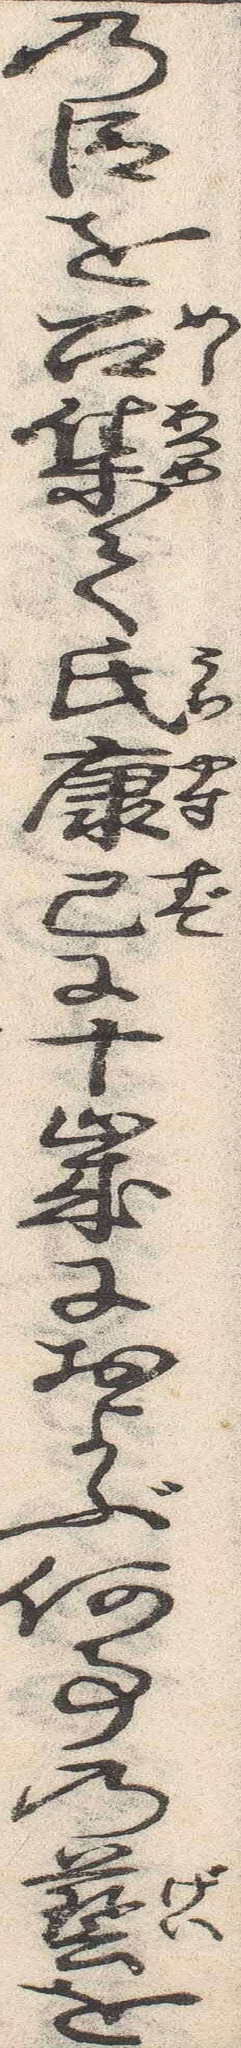の臣を召集て氏康已に十歳におよぶ何事の芸を
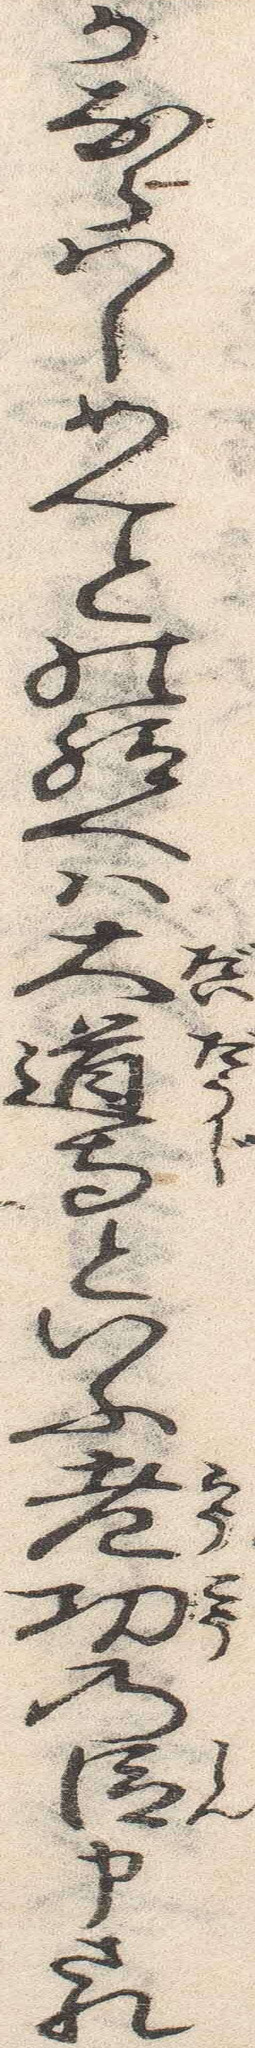かならはしめんとの給へは大道寺といふ老功の臣申され
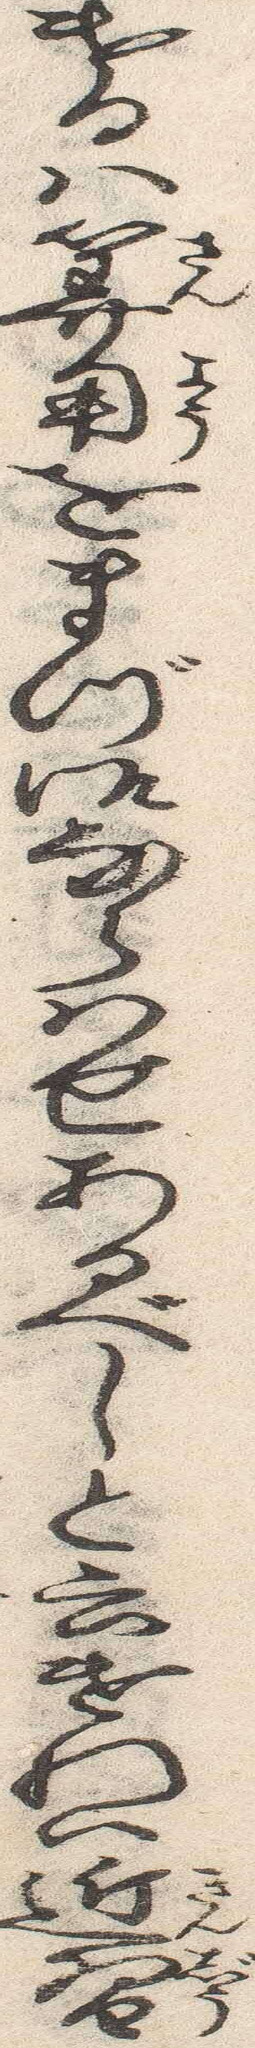けるは算用をまづ御ならはせあるべしと云けれは近習
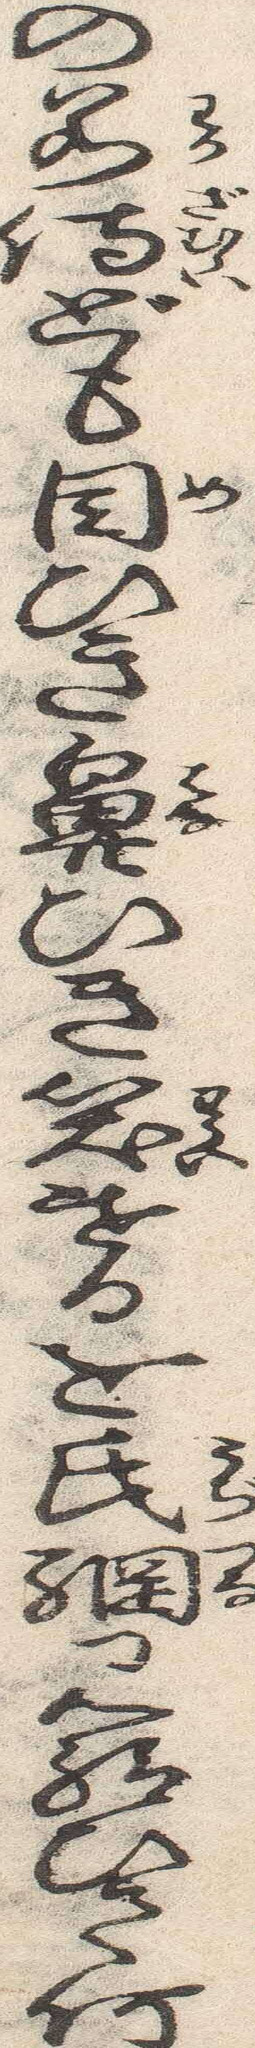の若侍ども目ひき鼻ひき笑けるを氏綱見給ひて何
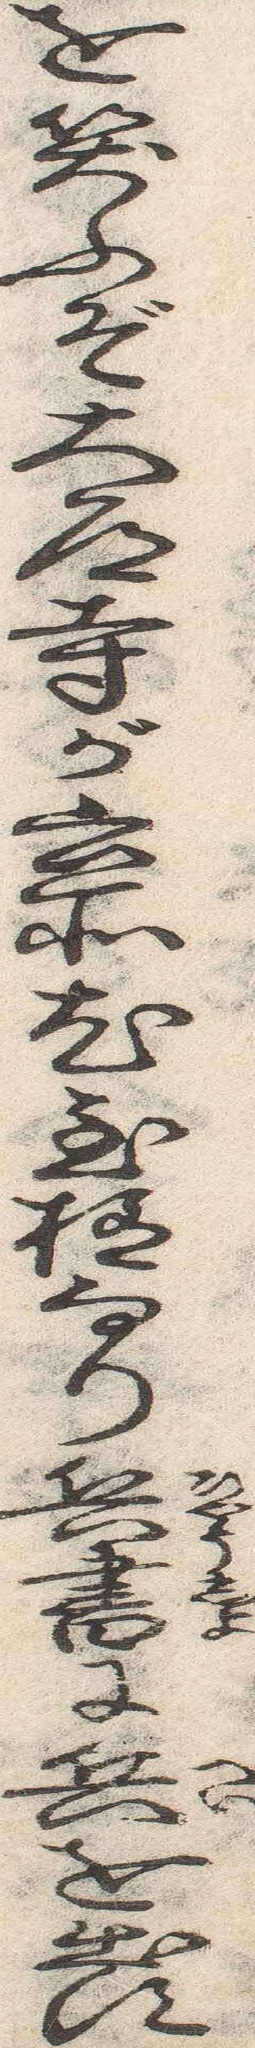を笑ふぞ大道寺が云所尤至極なり兵書に兵を出す
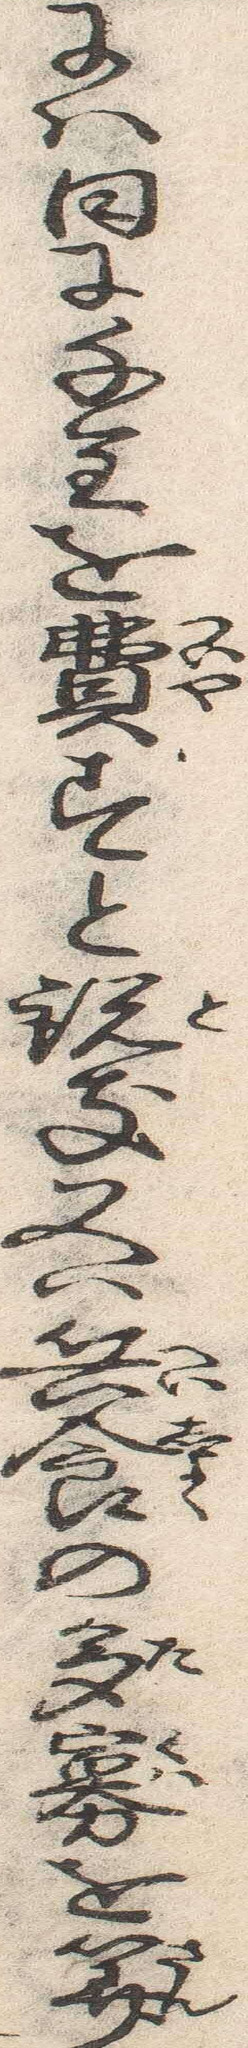には日に千金を費すと説き又は兵食の多寡を算
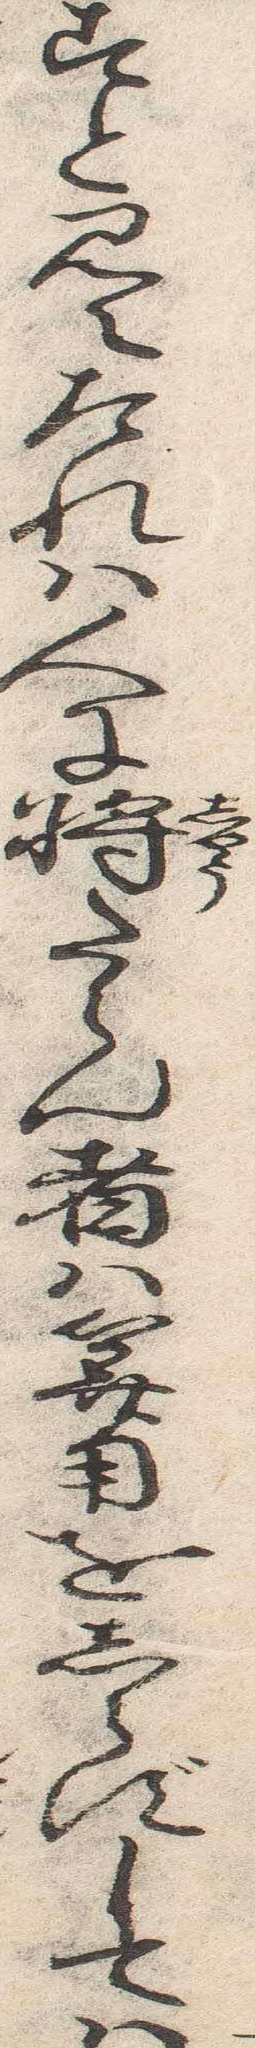すと見えたれは人に将たらん者は算用をしらずしては
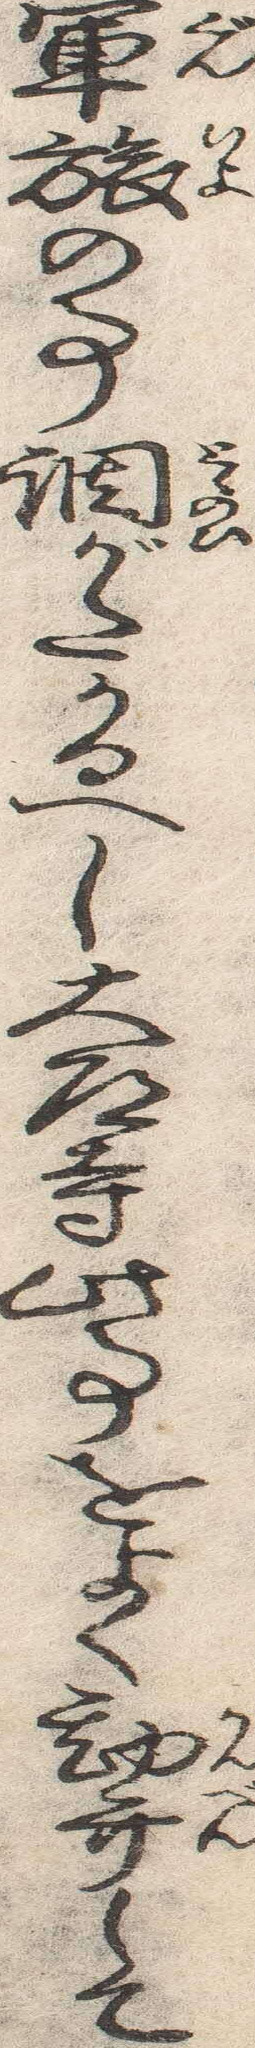軍旅の事調がたかるへし大道寺此事をよく勘弁して
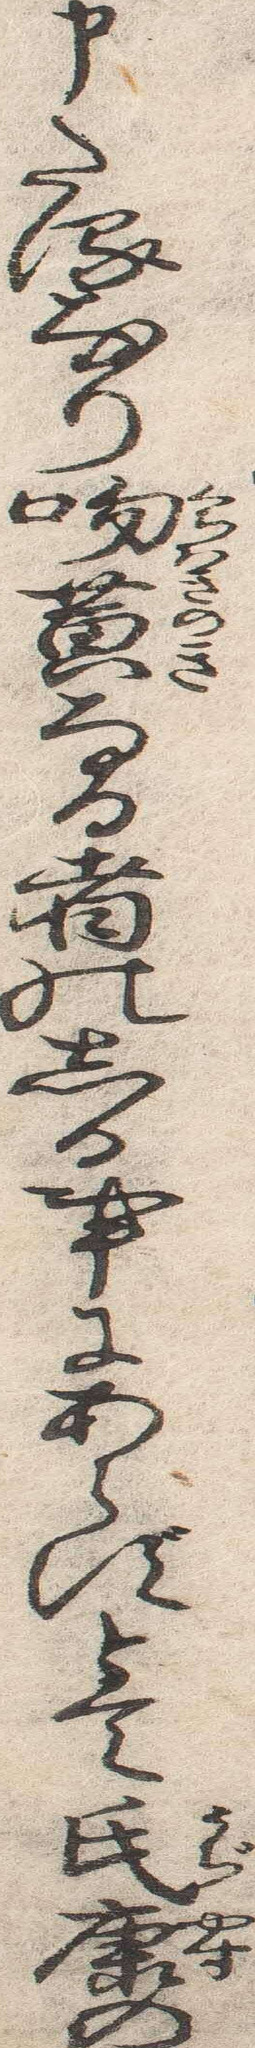申たるなり吻黄なる者のしる事にあらずとて氏康の
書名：小児必用養育草
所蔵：東京学芸大学附属図書館 国文学研究資料館
